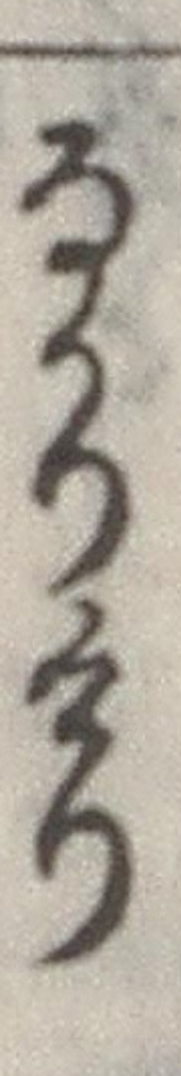なかりけり
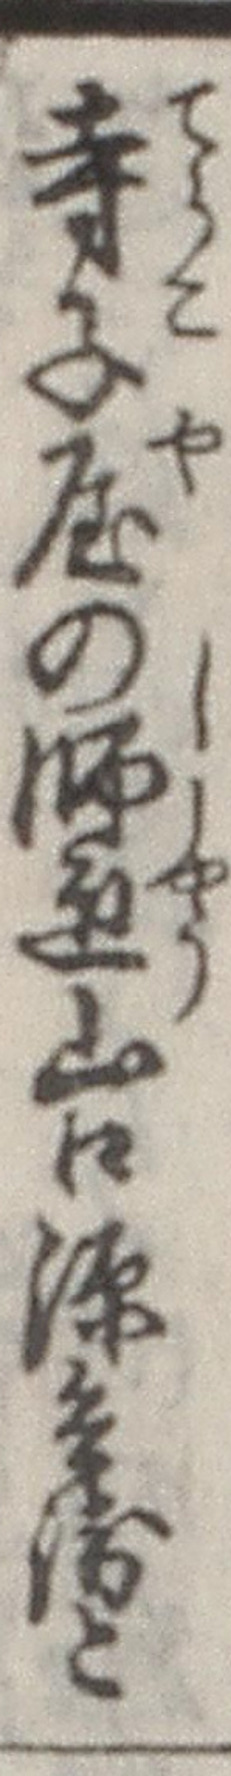寺子屋の師匠山口源兵衛と
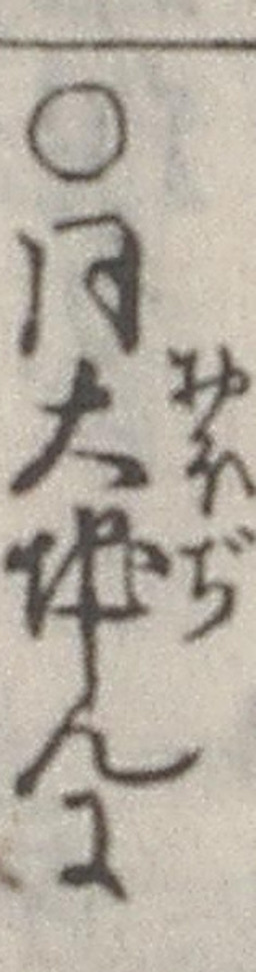○同大地しんに
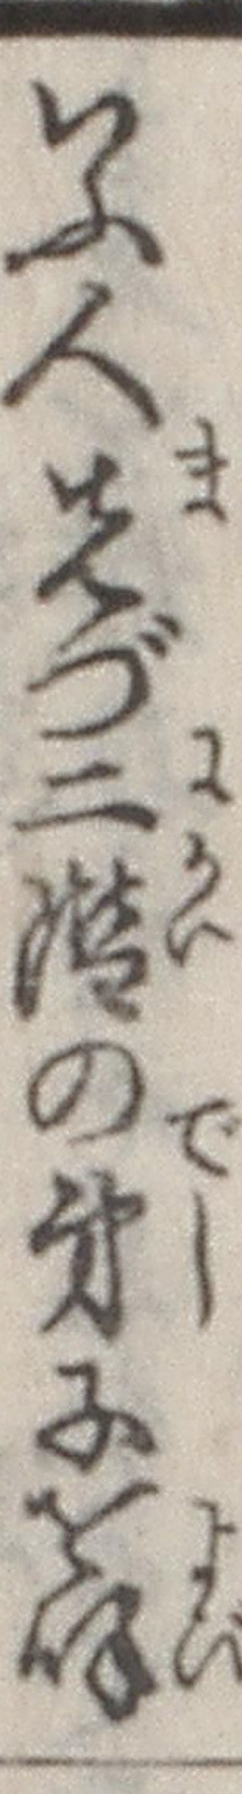いふ人先づ二階の弟子を呼
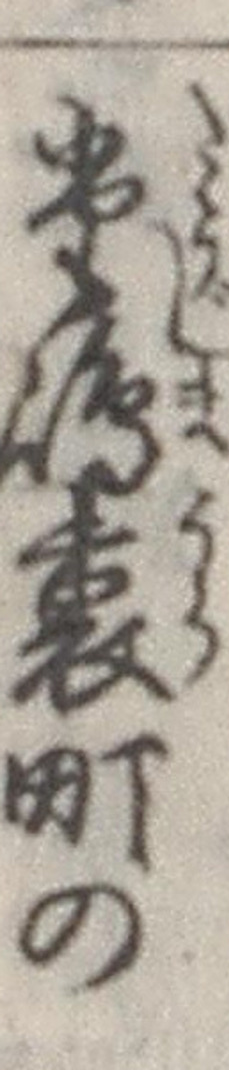堂嶋裏町の
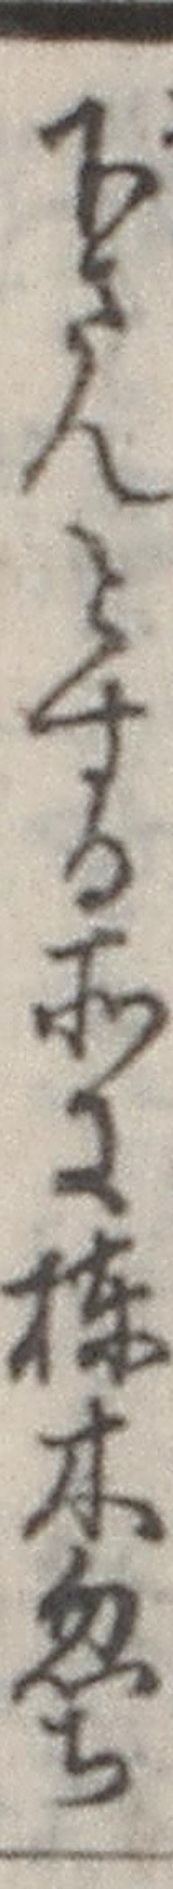下さんとする所に棟木忽ち
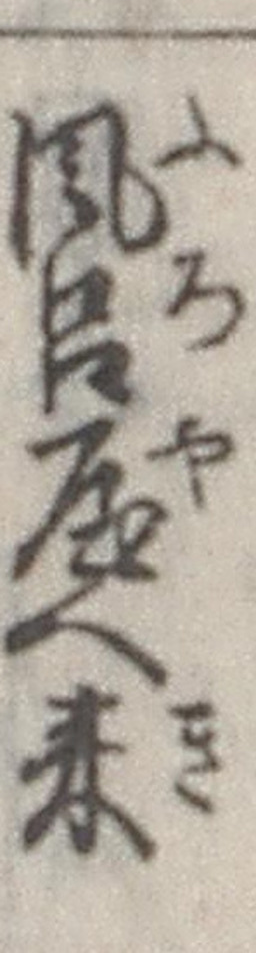風呂屋へ来
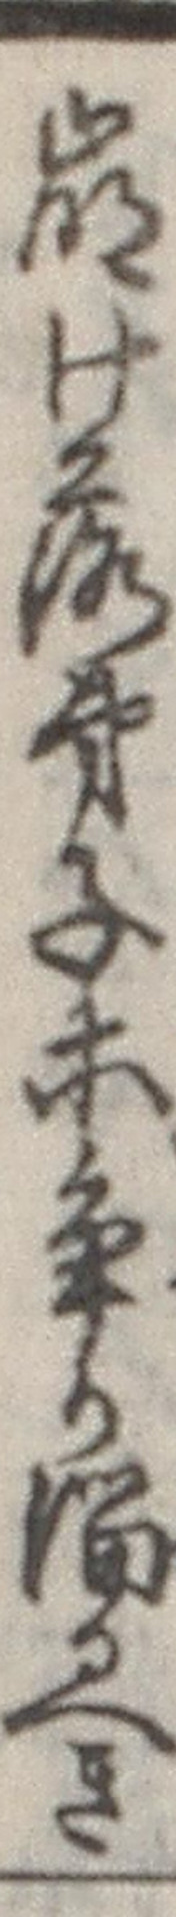崩け落弟子等争か溜るへき
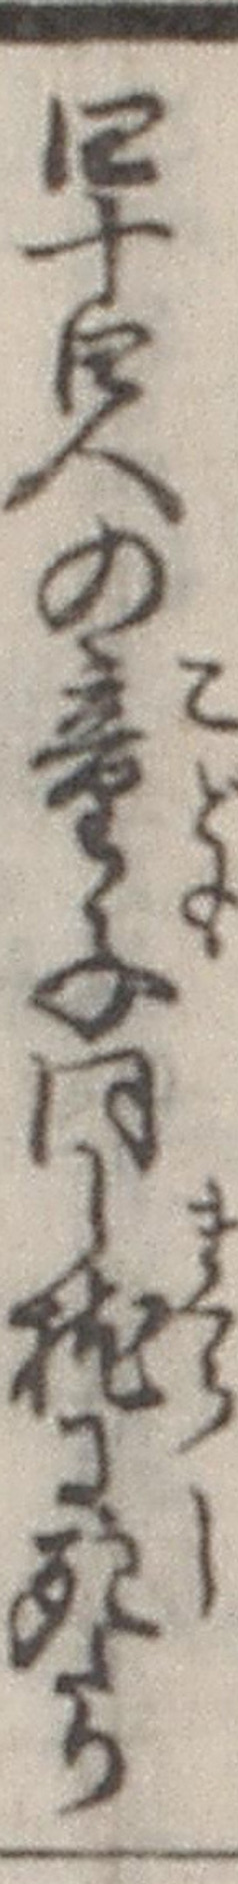四十四人の童子同じ枕に死たり
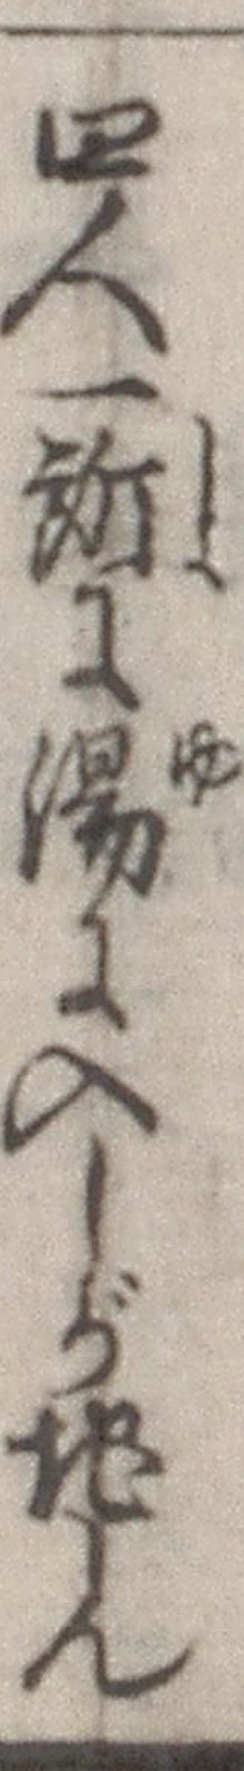四人一所に湯に入しが地しん
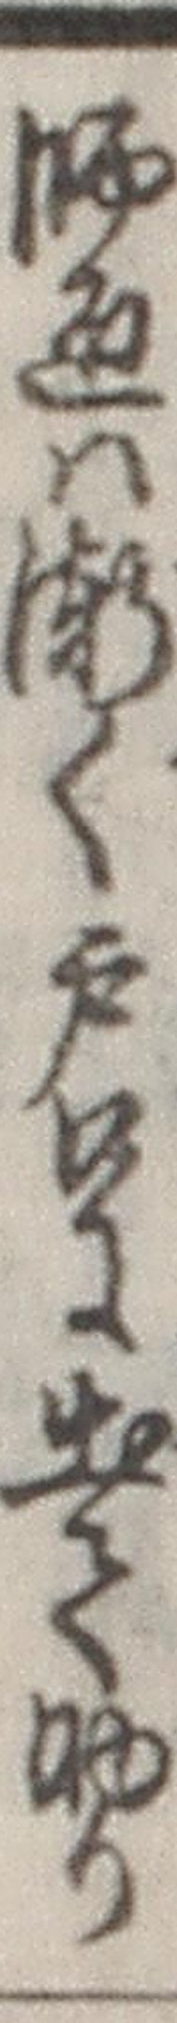師匠は漸く戸口に出て助り
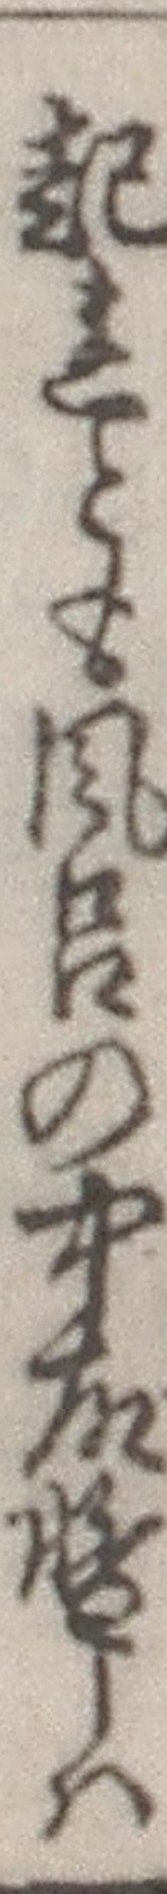起れとも風呂の中故暫しは
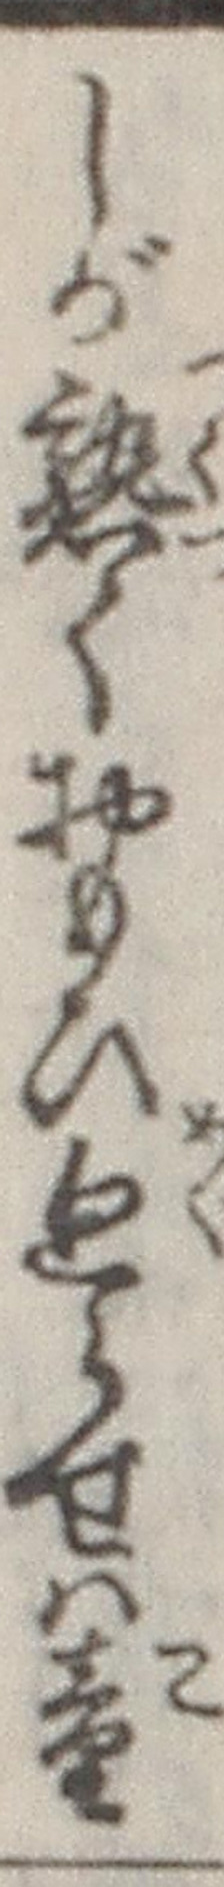しが熟くおもひ廻らせば童
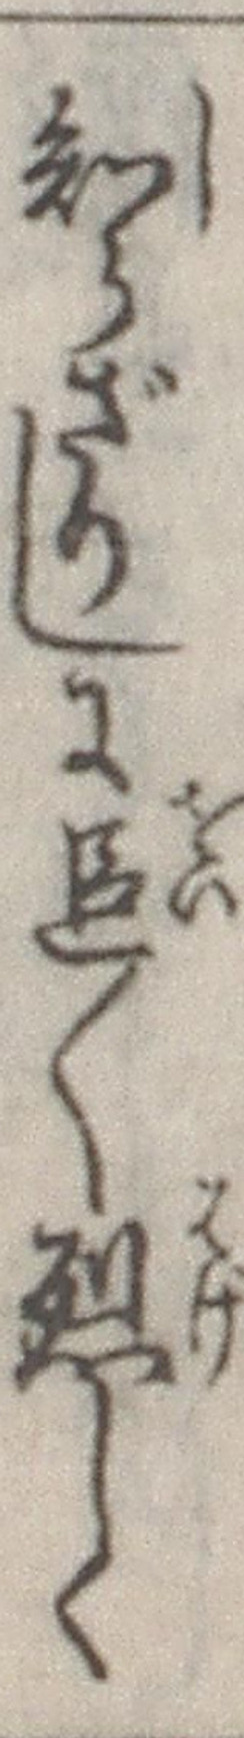知らざりしに追〱激しく
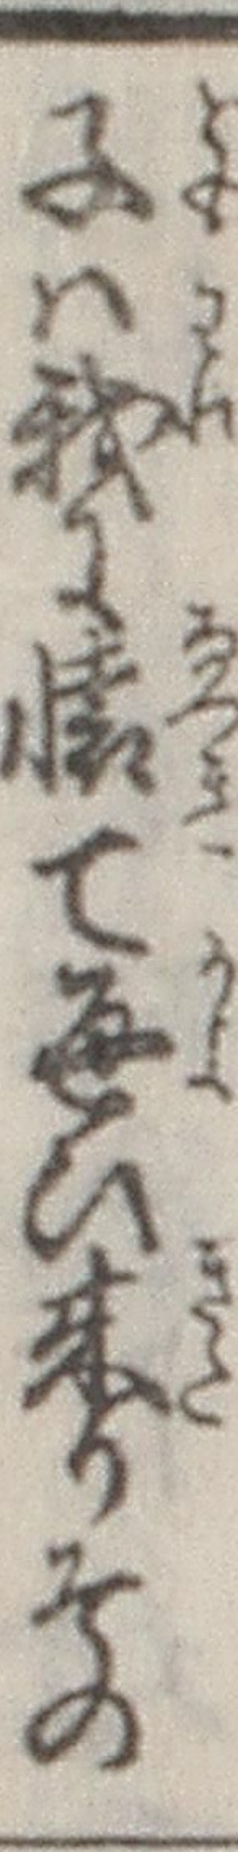子は我に懐て通ひ来りその
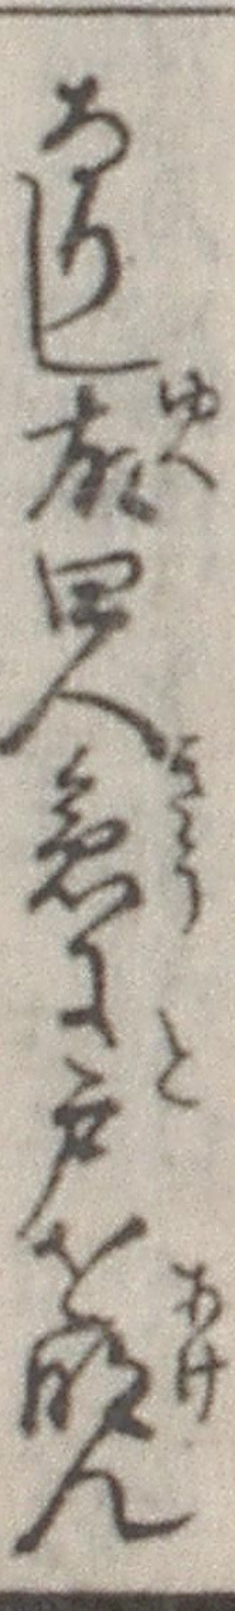なりし故四人急に戸を明ん
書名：諸國大地震年代記　末代噺種
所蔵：東京大学地震研究所図書室 Earthquake Research Institute Library, The University of Tokyo, JAPAN
